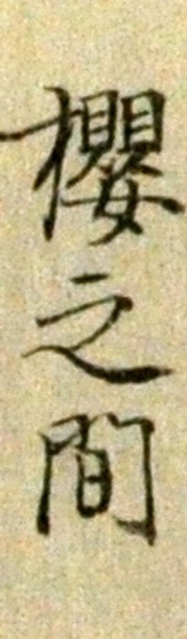桜之間
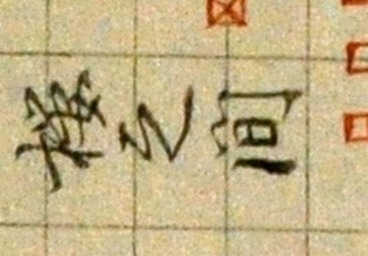桜之間
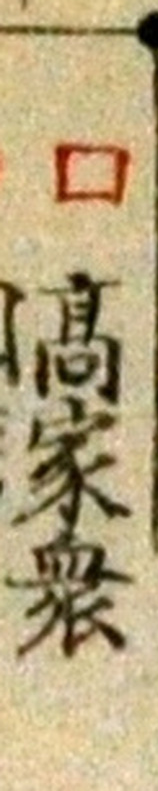高家衆
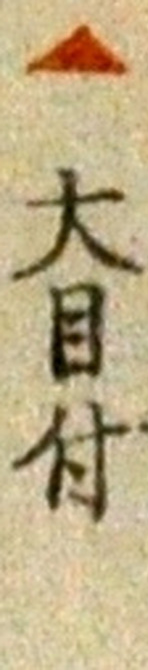大目付
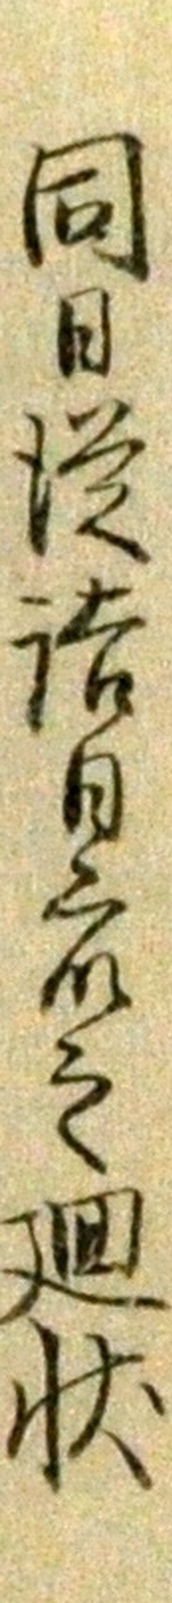同日従詰日衆之廻状
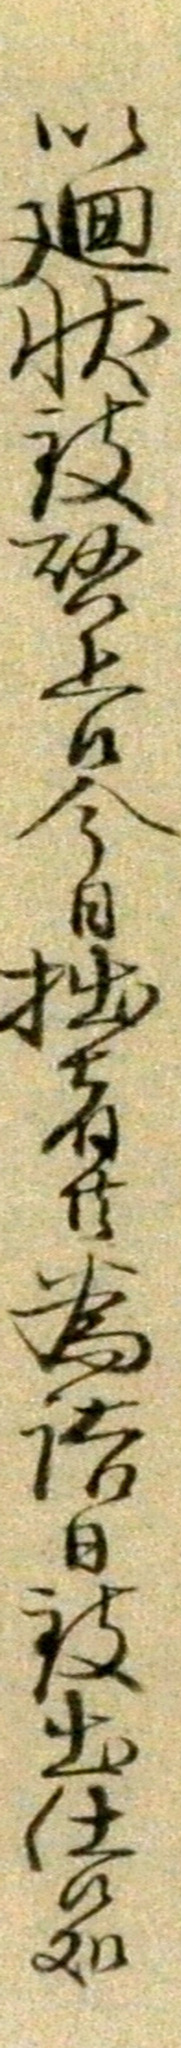以廻状致啓上候今日拙者共為詰日致出仕候処
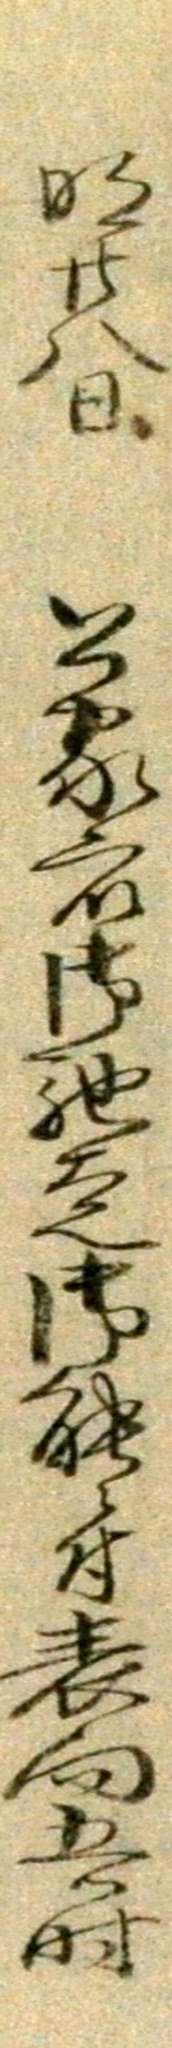明廿八日公家衆御馳走御能ニ付表向五ツ時
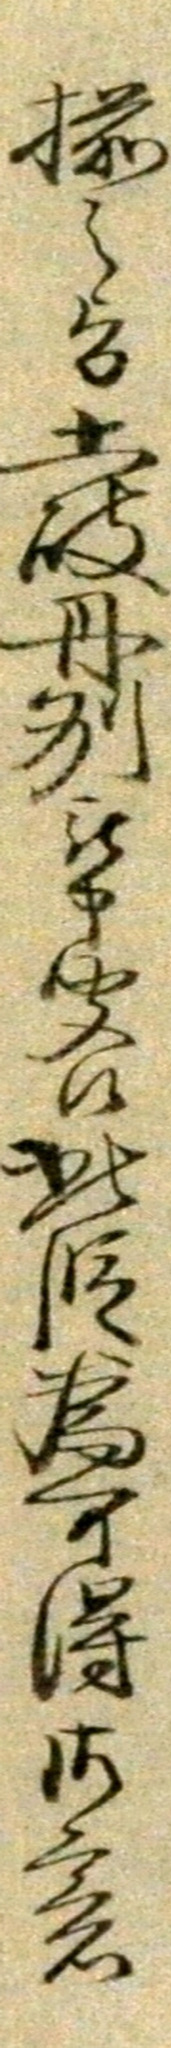揃之旨土岐丹州被申聞候此段為可得御意
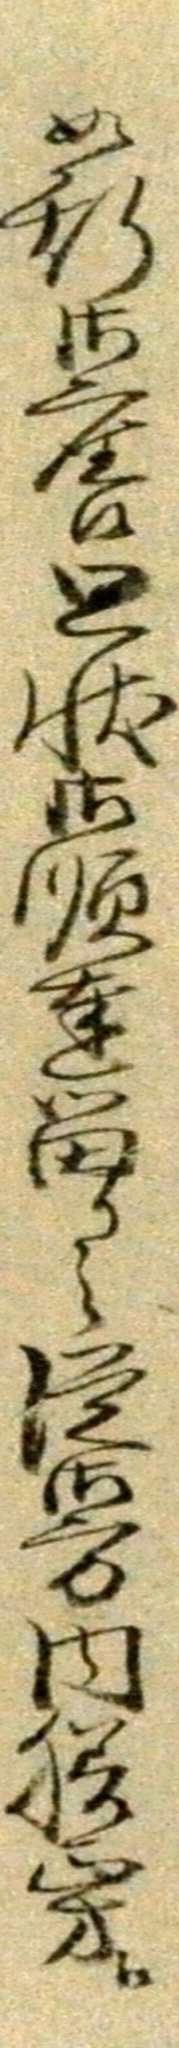如斯御座候廻状御順達留り之従御方内膳正方え
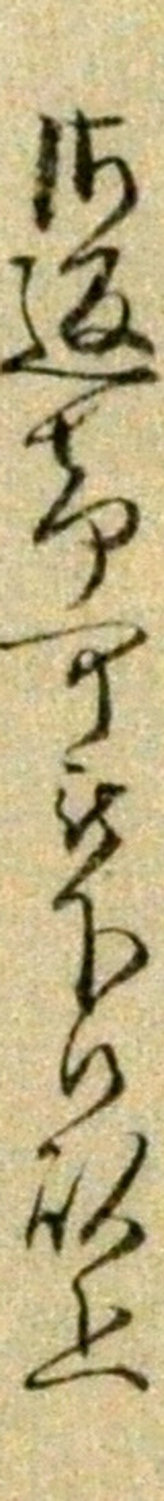御返却可被下候以上
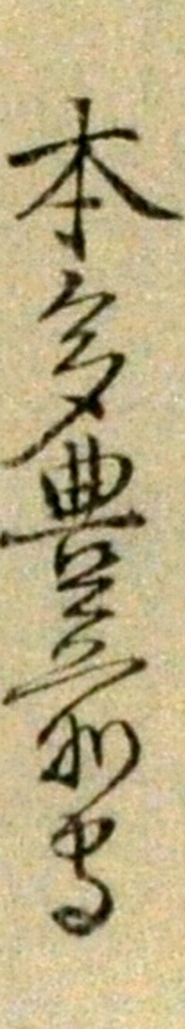本多豊前守
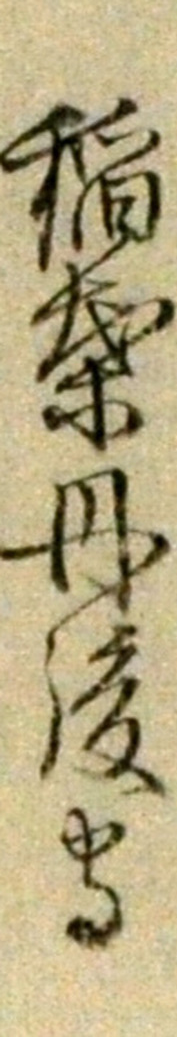稲葉丹後守
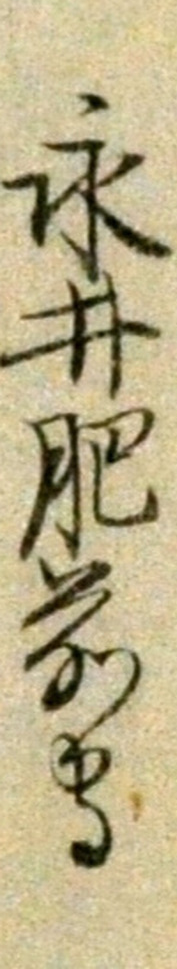永井肥前守
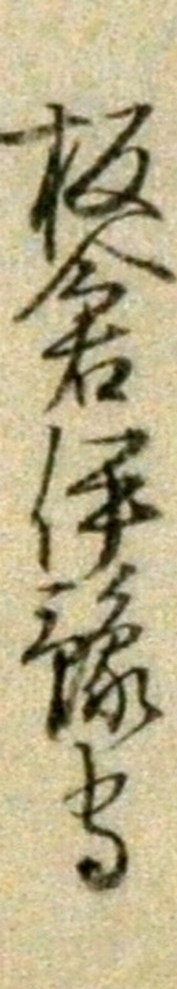板倉伊予守
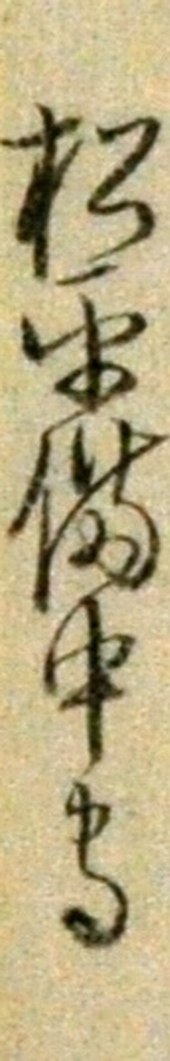松平備中守

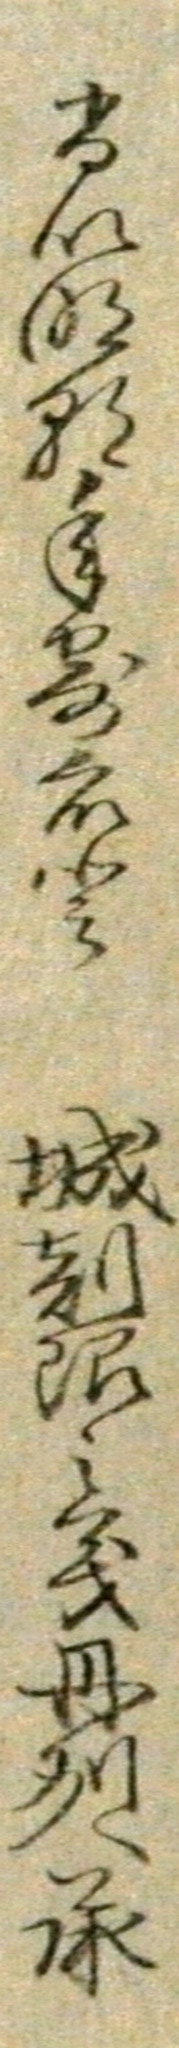尚以明朝年寄衆登城刻限之義丹州ヘ承
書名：諸留書〔一括〕
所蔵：伊那市立高遠町図書館・合同会社AMANE
